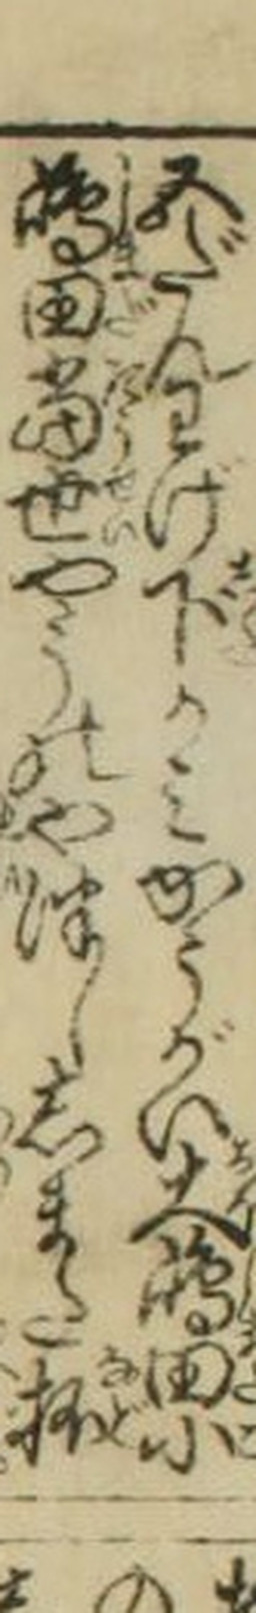嶋田當世やうのやつししまた抔
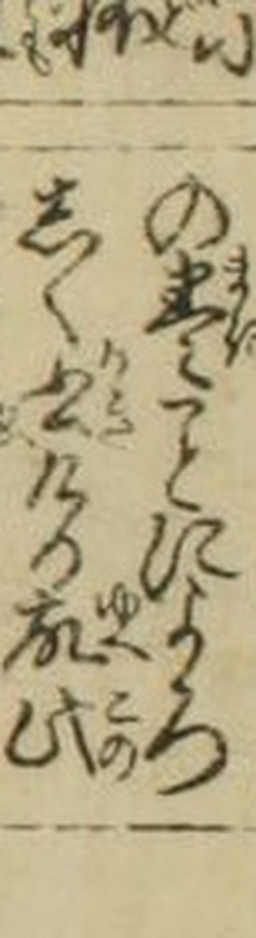しく書ける故此
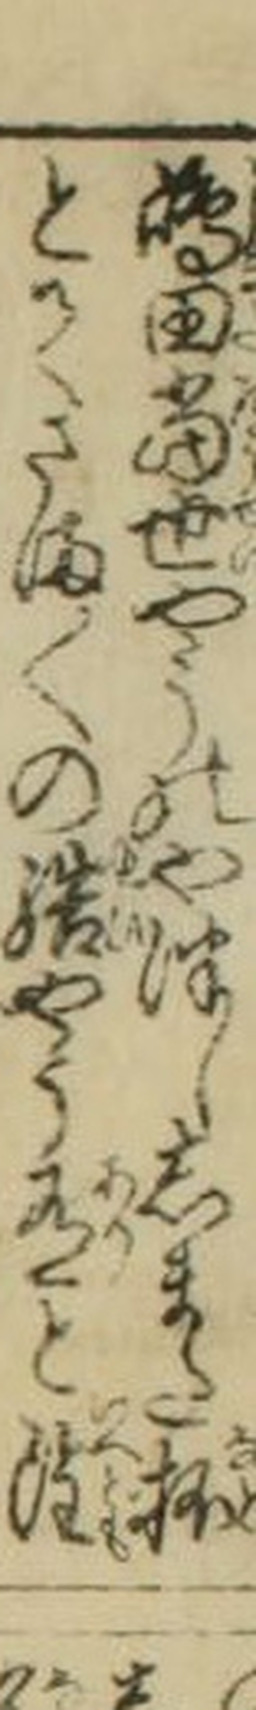とてさま〳〵の結やう有と雖
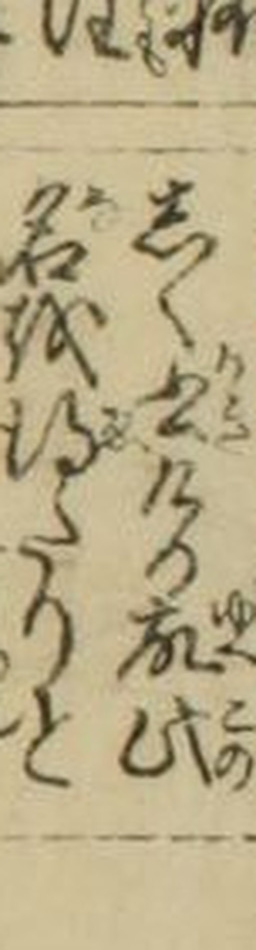名を得たりと
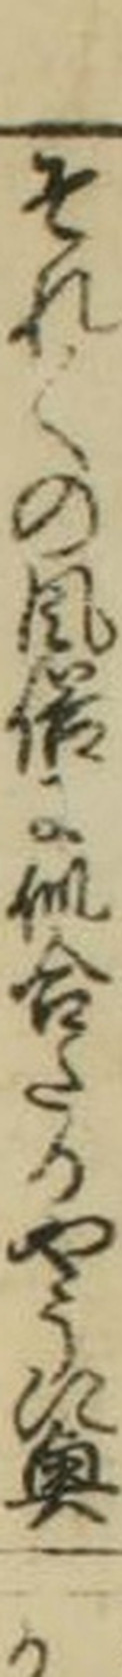それ〳〵の風俗に似合たるやうに奥
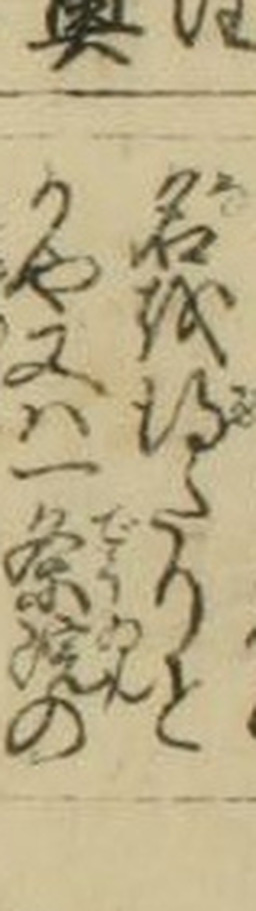かや又は一条院の
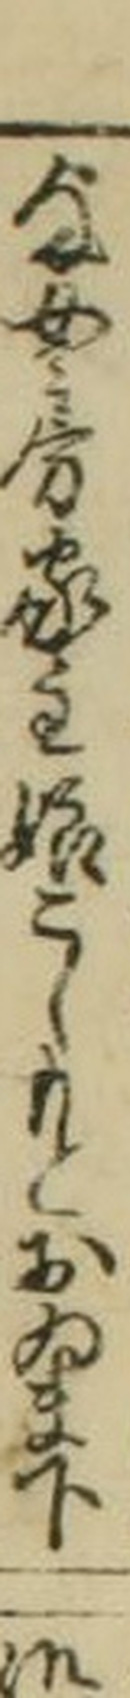さま女房家主嫁こしもとおゐま下
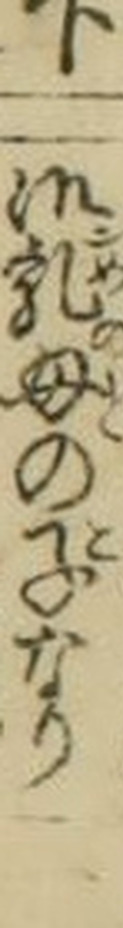御乳母の子なり
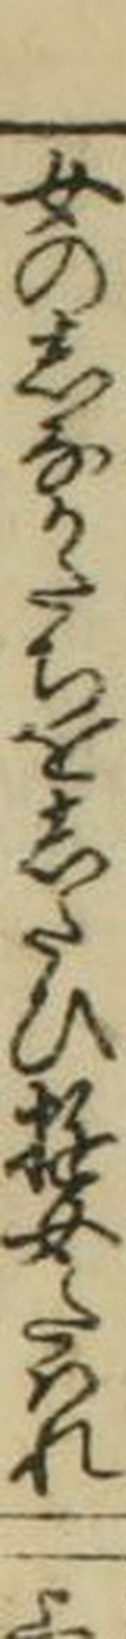女のしなかたちをしたひ遊女たはれ
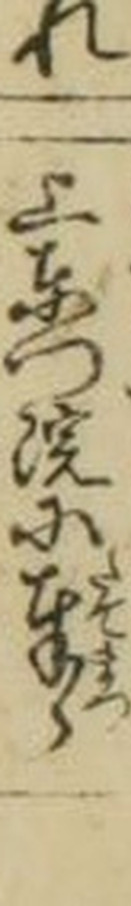上東門院に奉ら
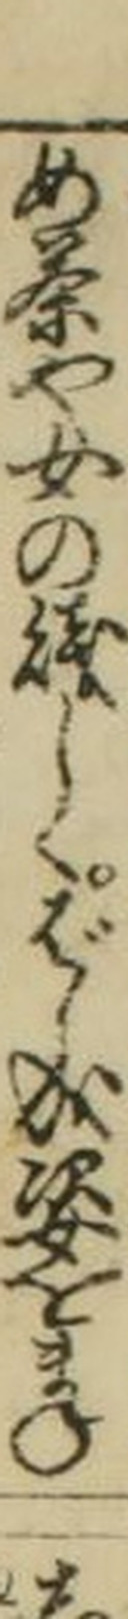め茶や女の賎しく。ばし成すがたをまね
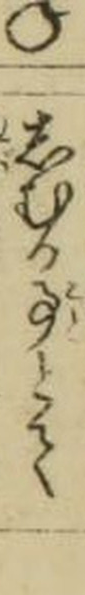しむる事とて
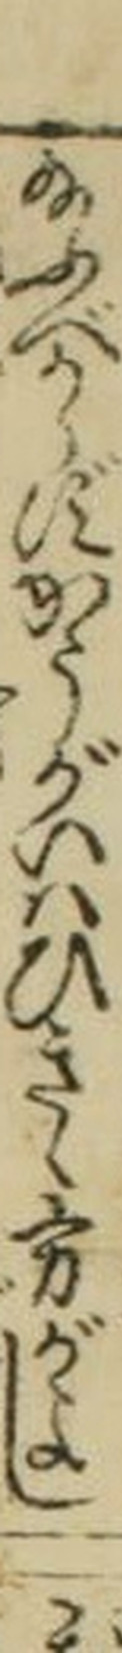給ふべからずにかうがいはひきゝ方がよし
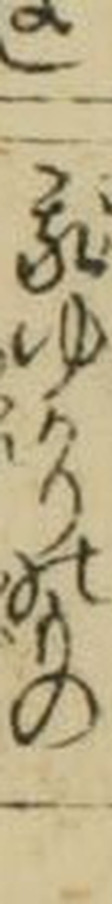我ゆかりのもの
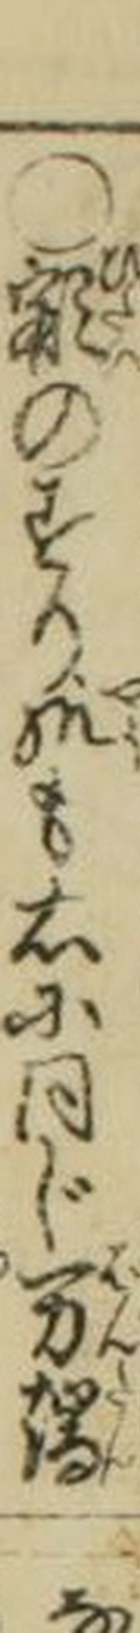◯額のすり様も右に同じ万端
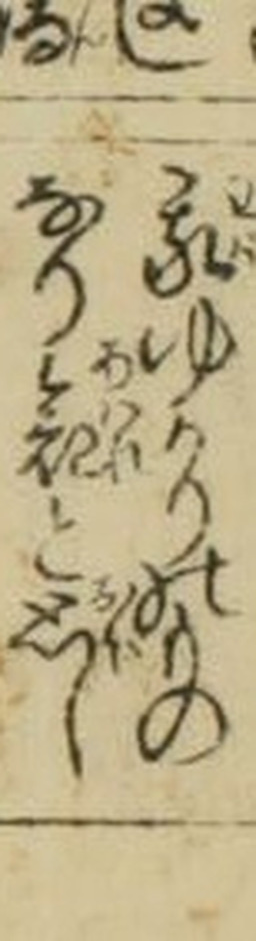なり哀と思し
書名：女源氏教訓鑑
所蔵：東京学芸大学附属図書館
